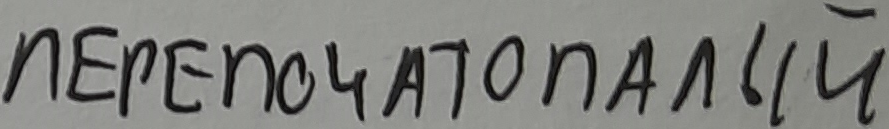перепочатопалый
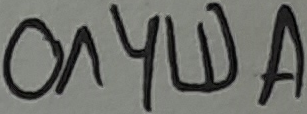олуша
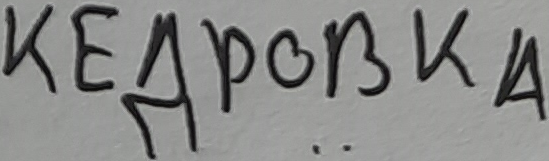кедровка
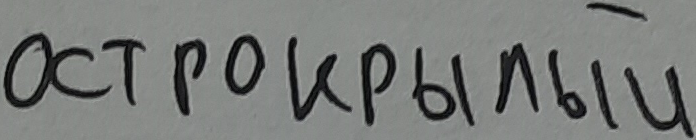острокрылый
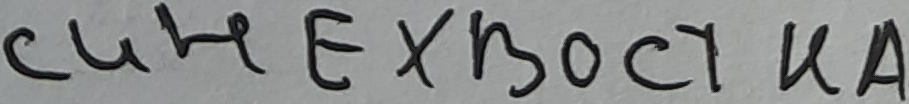синехвостка
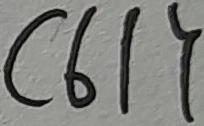сыч
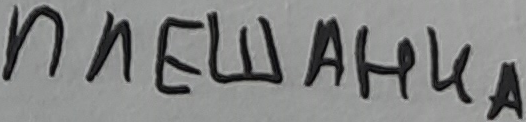плешанка
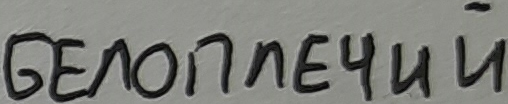белоплечий
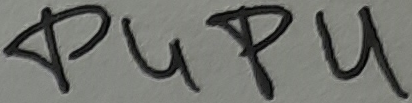фифи
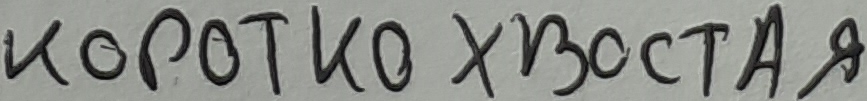коротко хвостая
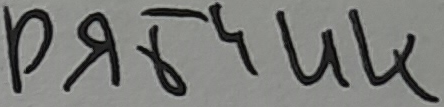рябчик
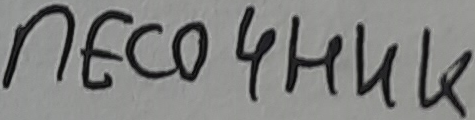песочник
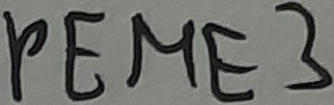ремез
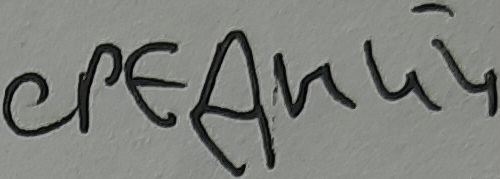средний
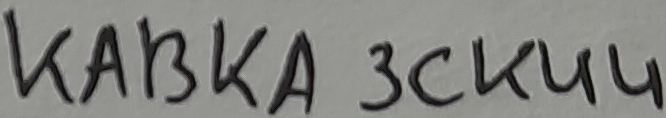кавка зский
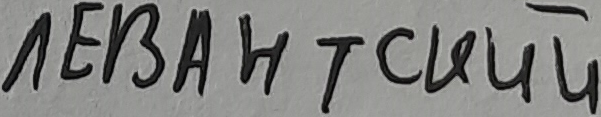левантский
